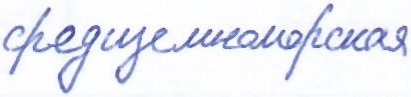средиземноморская
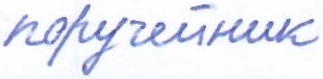поручейник
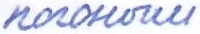погоныш
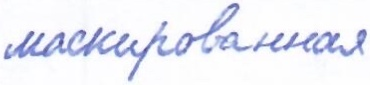маскированная
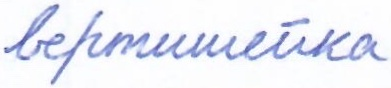вертишейка
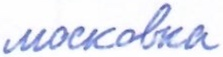московка
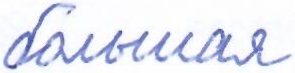большая
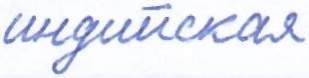индийская
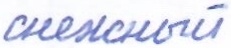снежный
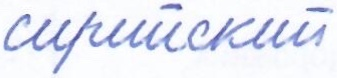сирийский
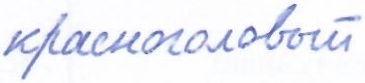красноголовый
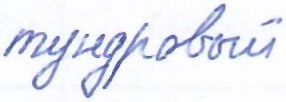тундровый
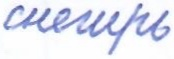снегирь
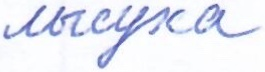лысуха
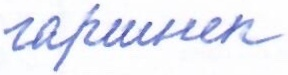гаршнеп
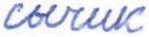сычик
